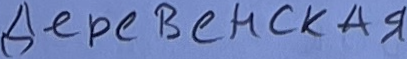деревенская
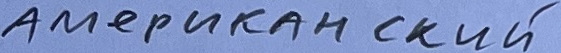американский
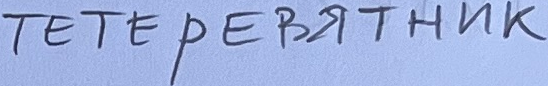тетеревятник
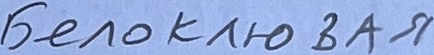белоклювая
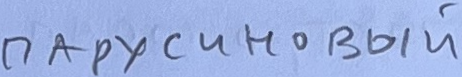парусиновый
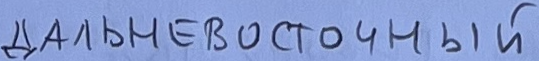дальневосточный
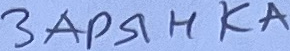зарянка
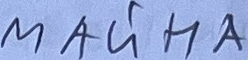майна
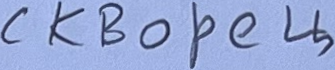скворец
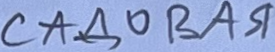садовая
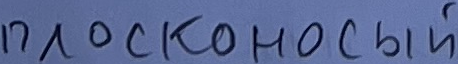плосконосый
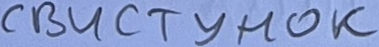свистунок
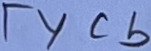гусь
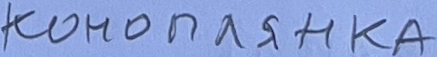коноплянка
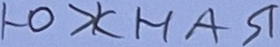южная
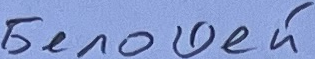белошей
